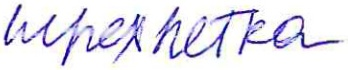трехпетка
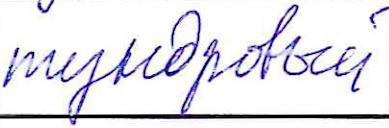тундровый
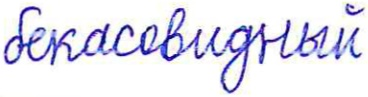бекасовидный
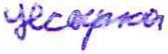цесарка
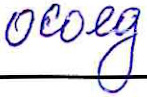осоед
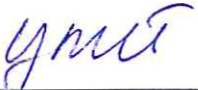улит
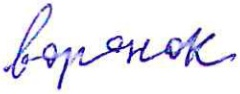воронок
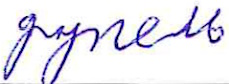дупель
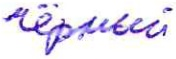чёрный
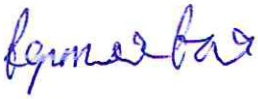вертлявая
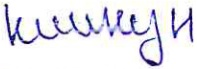кликун
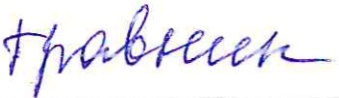травник
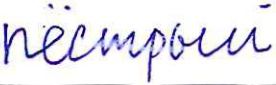пёстрый
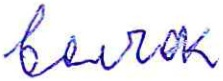волчок
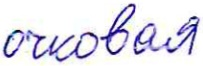очковая
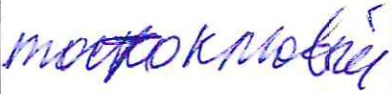тостоклювый
